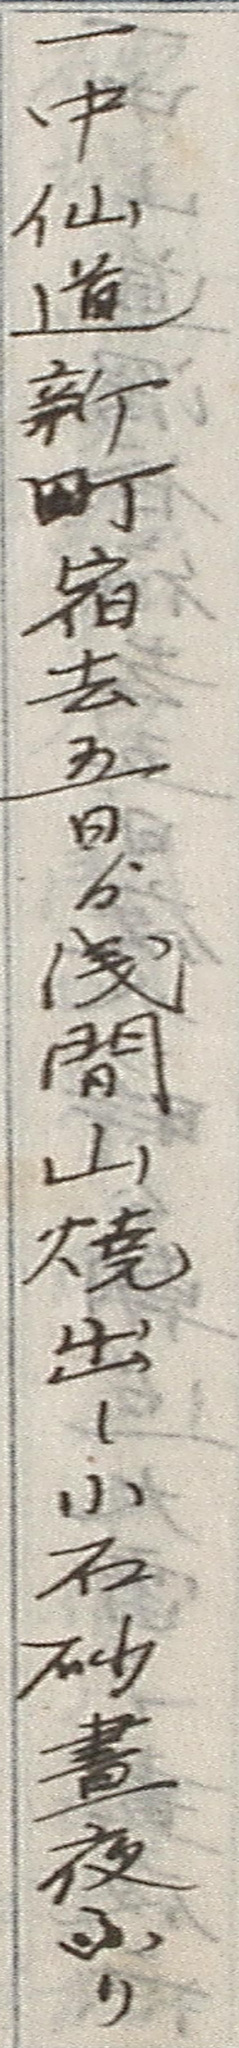一中仙道新町宿去五日ゟ浅間山焼出し小石砂昼夜ふり
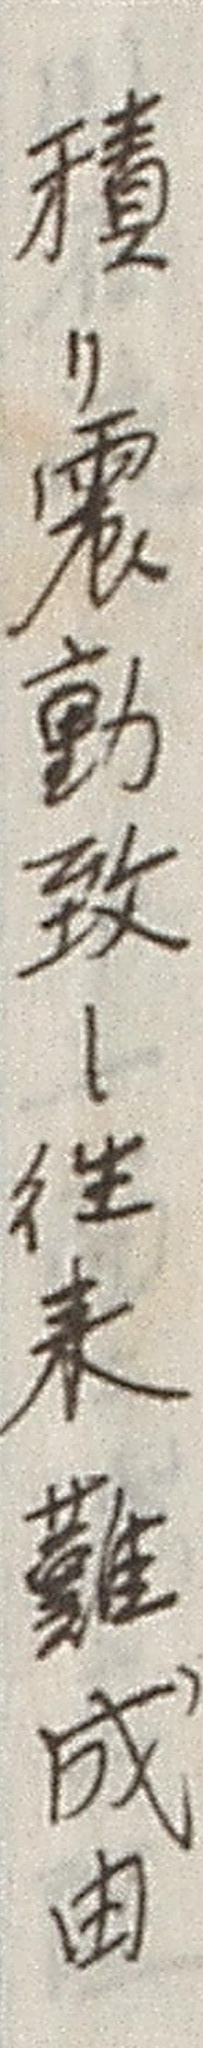積リ震動致し往来難成由
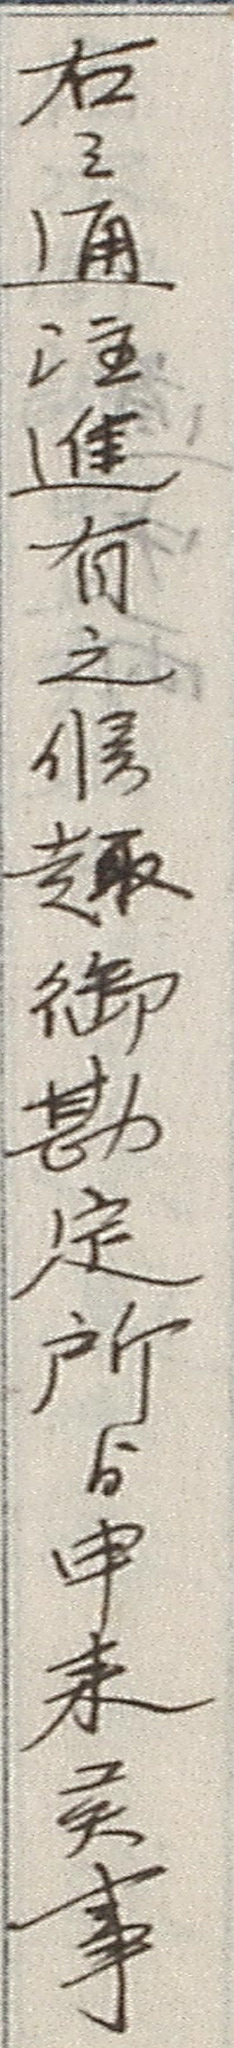右之通注進有之候趣御勘定所ゟ申来候事
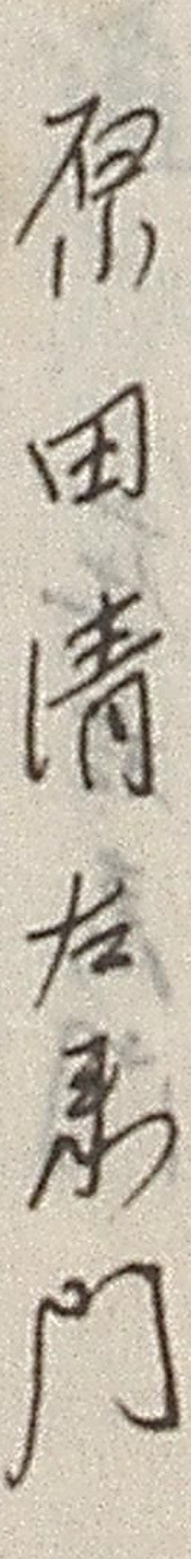原田清左衛門
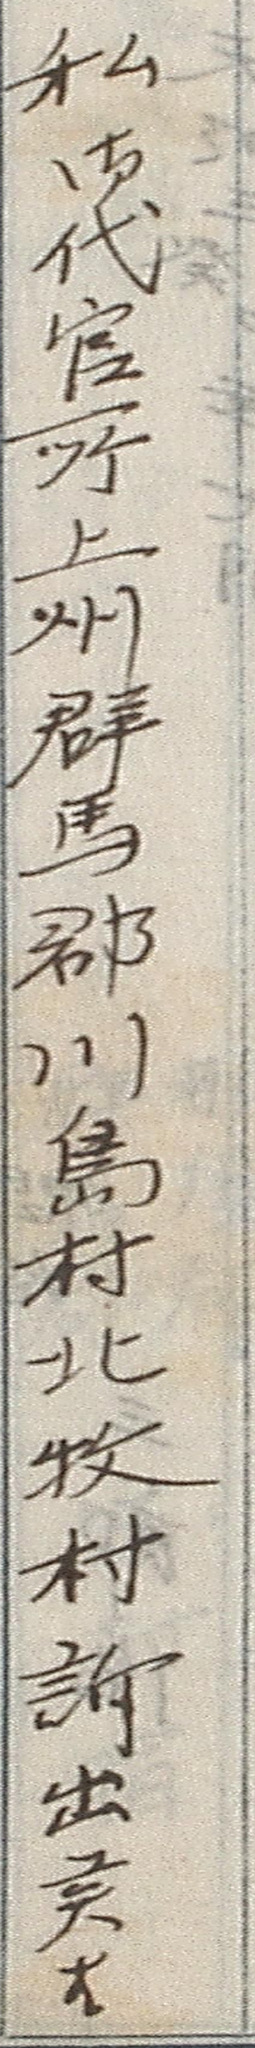私御代官所上州群馬郡川島村北牧村訴出候者
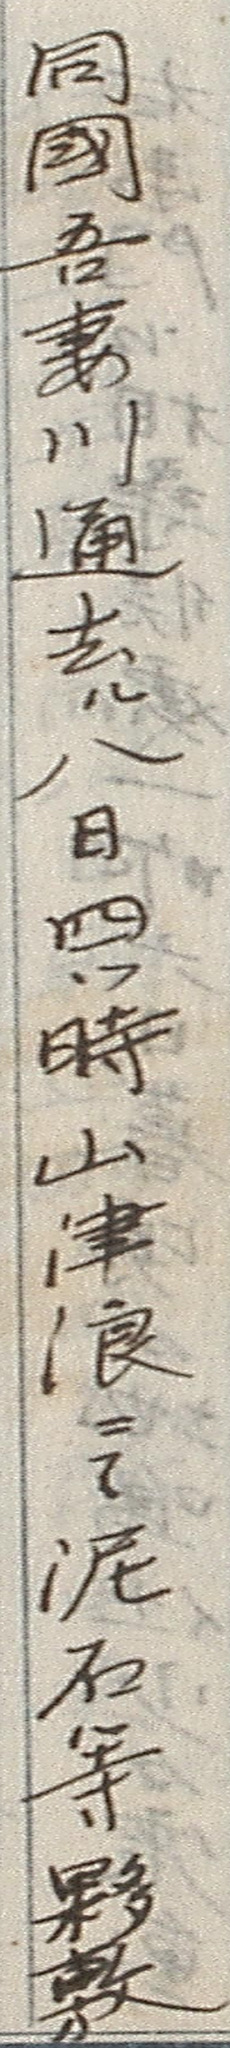同国吾妻川通去ル八日四ツ時山津浪二て泥石等夥敷
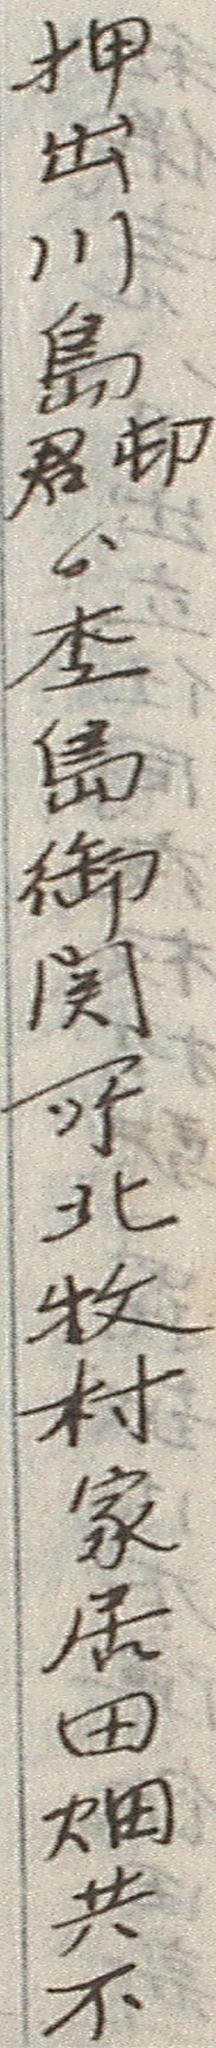押出川島邨ゟ杢島御関所北牧村家居田畑共不
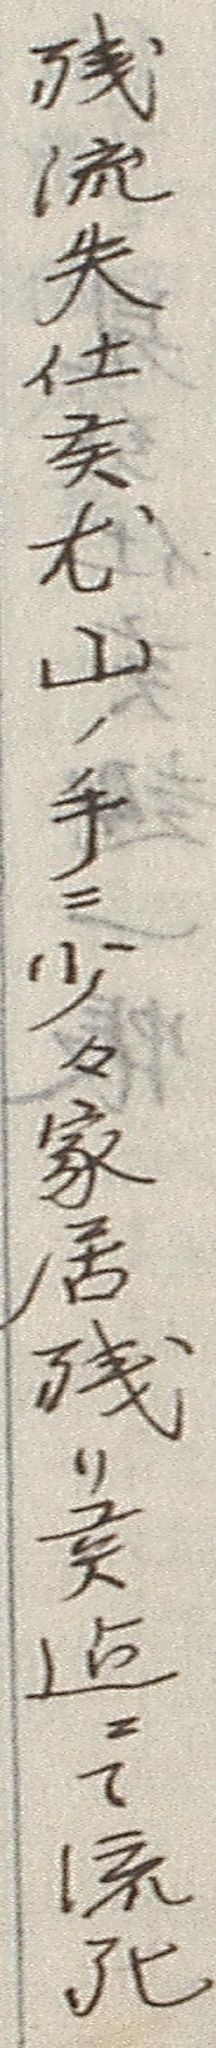残流失仕候尤山ノ手二少々家居残リ候迄二て流死
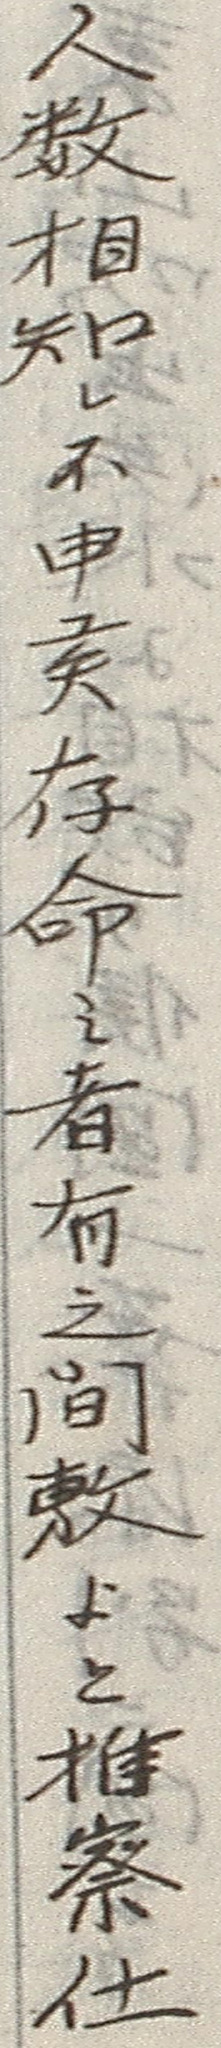人数相知レ不申候存命之者有之間敷よと推察仕
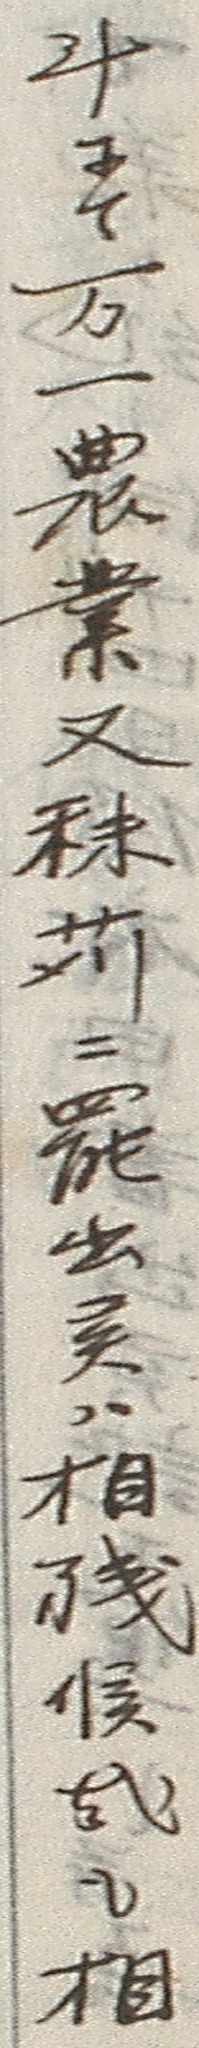斗にて万一農業又秣苅二罷出候ハ相残候哉も相
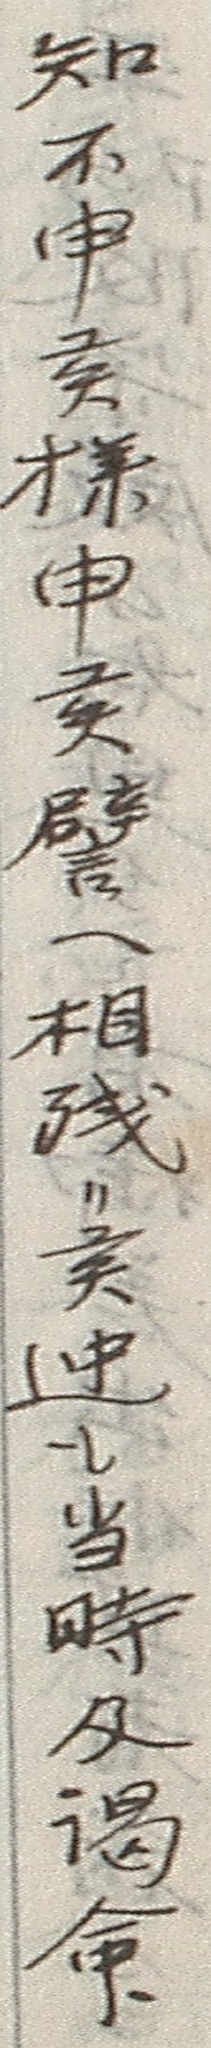知不申候様申候譬へ相残リ候迚も当時及渇命
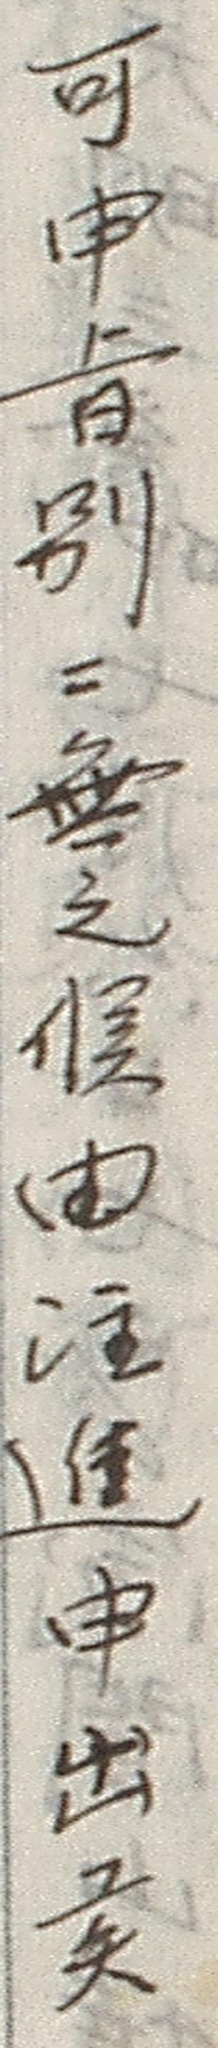可申旨別ニ無之候由注進申出候
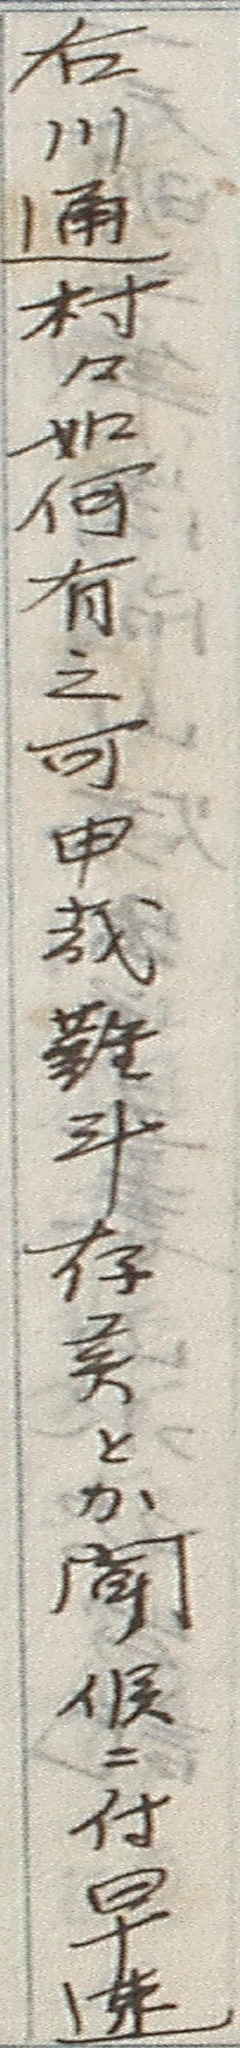右川通村々如何有之可申哉難斗存候とか聞候ニ付早速
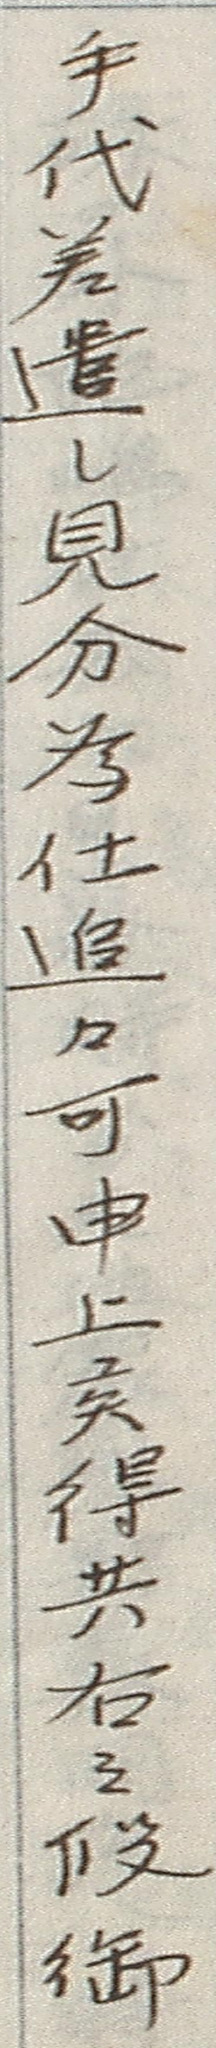手代差遣し見分為仕追々可申上候得共右之段御
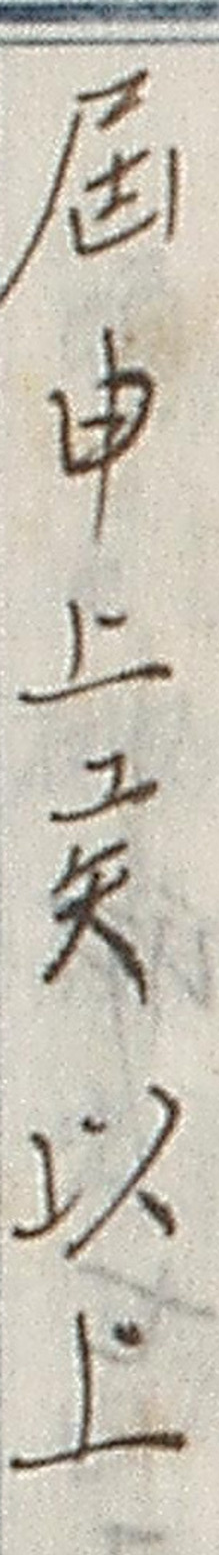届申上候以上

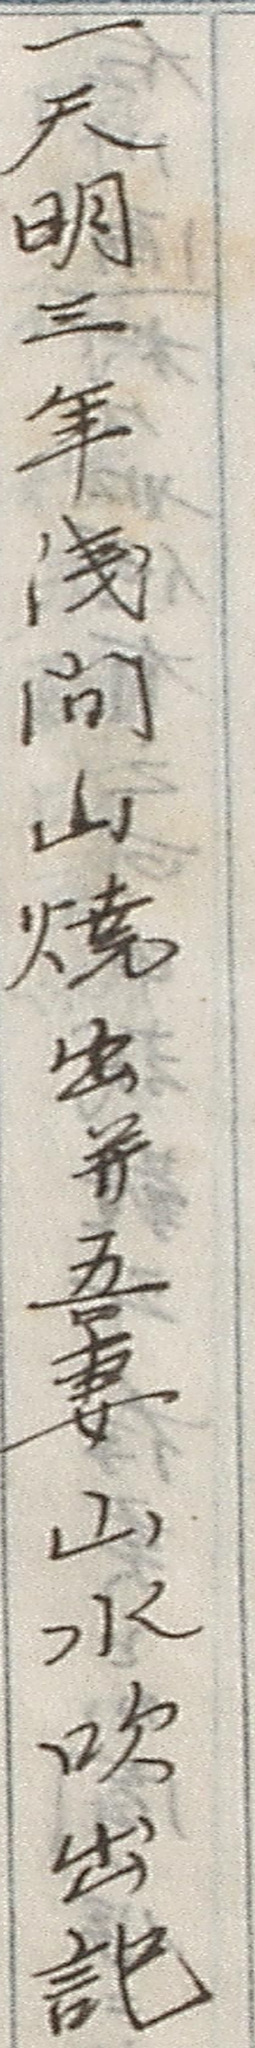一天明三年浅間山焼出并吾妻山水吹出記
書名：浅間山焼出記
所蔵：東京大学地震研究所図書室 Earthquake Research Institute Library, The University of Tokyo, JAPAN
